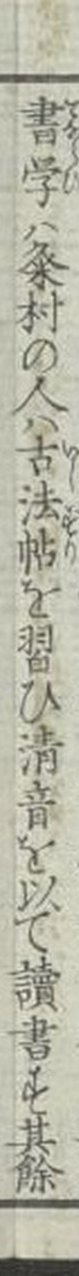書学は粂村の人は古法帖を習ひ清音を以て読書す其余
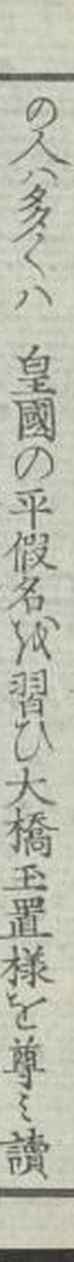の人は多くは皇国の平仮名を習ひ大橋玉置様を尊み読
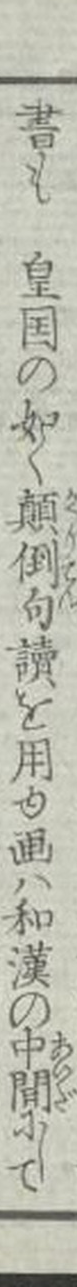書も皇国の如く顛倒句読を用ゆ画は和漢の中間にして
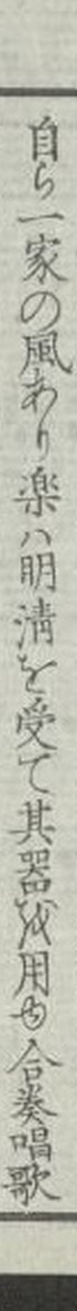自ら一家の風あり楽は明清を受て其器を用ゆ合奏唱歌
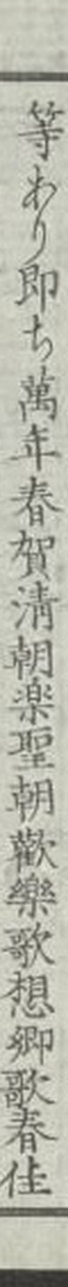等あり即ち万年春賀清朝楽聖朝歓楽歌想郷歌春佳
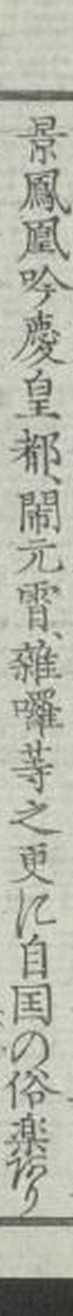景鳳凰吟慶皇都、閙元霄、雑囉等之更に自国の俗楽あり
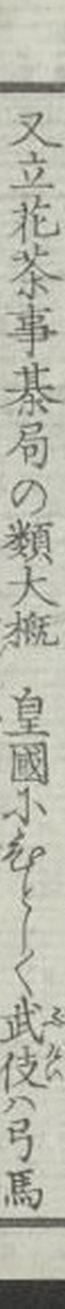又立花茶事棊局の類大概皇国にひとしく武伎は弓馬
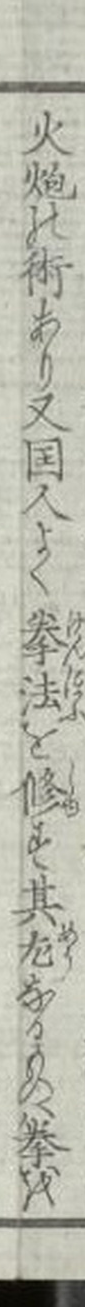火炮の術あり又国人よく拳法を修す其左なるものは拳を
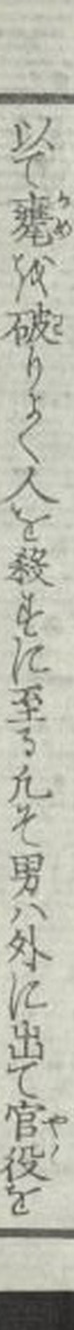以て甕を破りよく人を殺すに至る凡そ男は外に出て官役を
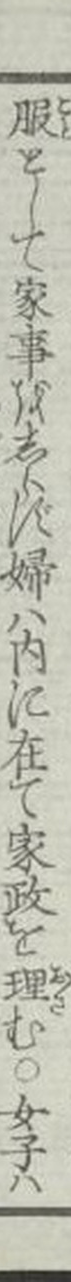服として家事をしらず婦は内に在て家政を理む○女子は
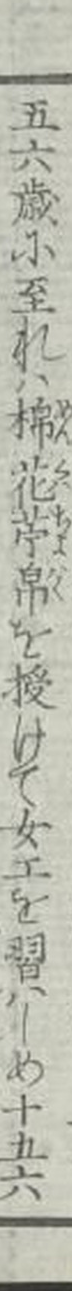五六歳に至れは棉花苧帛を授けて女工を習はしめ十五六
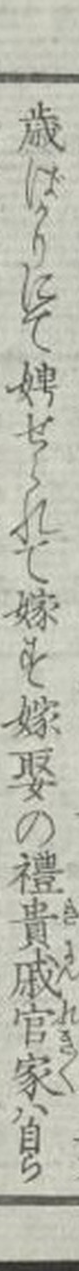歳ばかりにて娉せられて嫁す嫁娶の礼貴戚官家は自ら
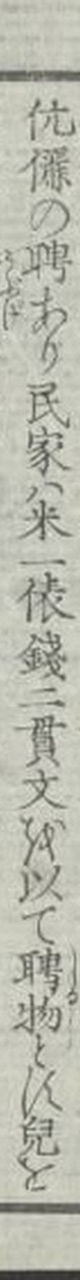伉儷の聘あり民家は米一俵銭二貫文を以て聘物とす児を
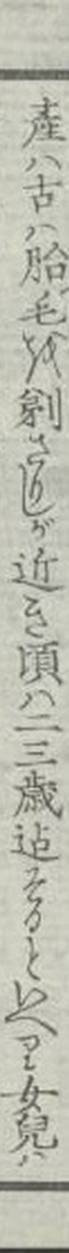産は古は胎毛を剃さりしが近き頃は二三歳迠そるといへり女児は
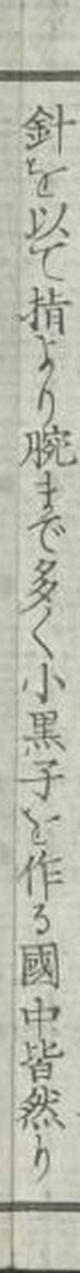針を以て指より腕まで多く小黒子を作る国中皆然り
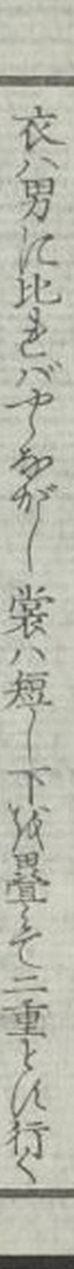衣は男に比ればやゝながし裳は短し下を畳みて二重とす行く
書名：中山国使略
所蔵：University of the Ryukyus Library
